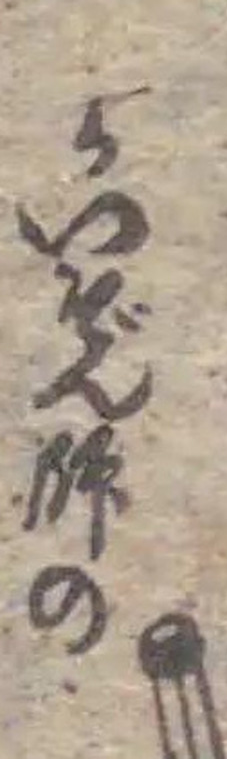かいぞん師の
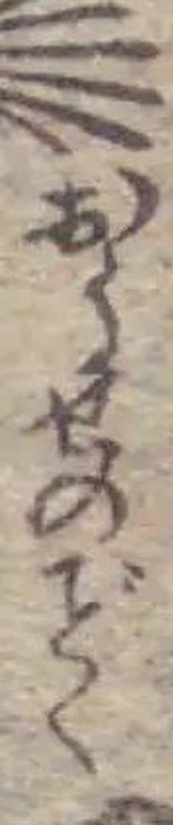おうせのごとく
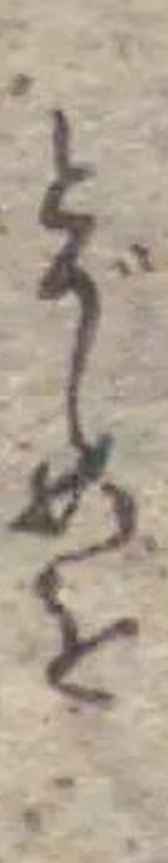とがしめを
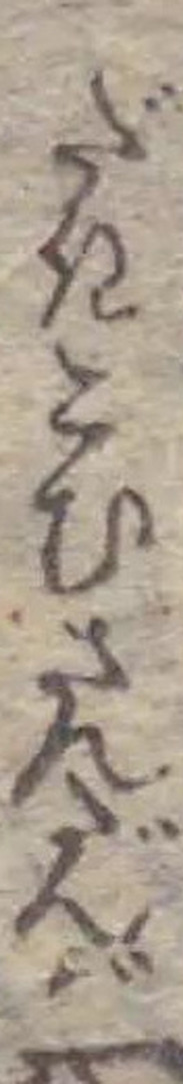だきこむさんだんが
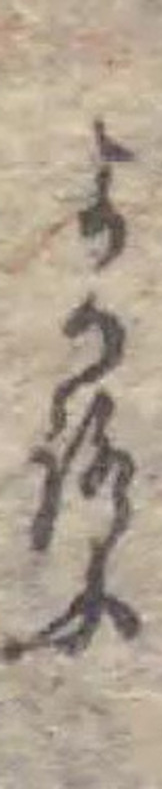よかろふ
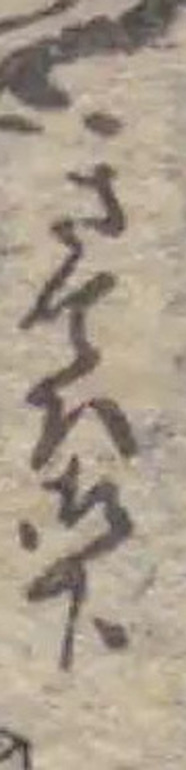さては御下
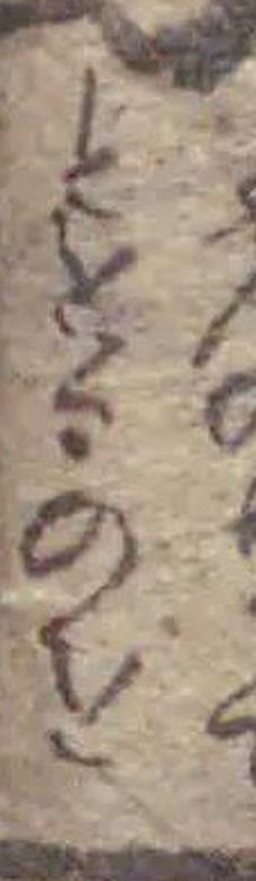とをるのを
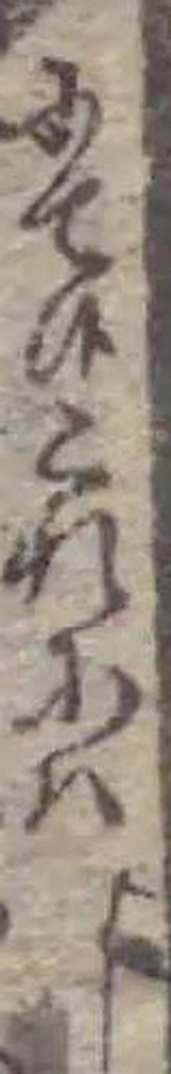にて候これには
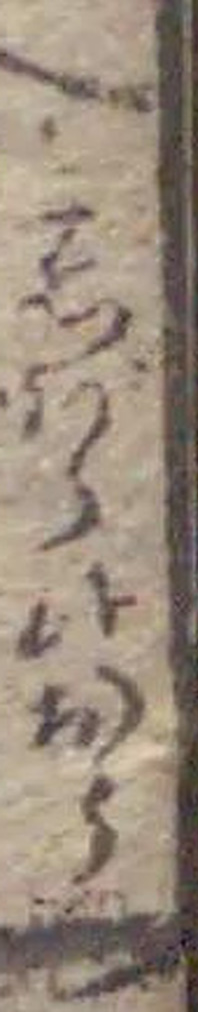しばら候おう
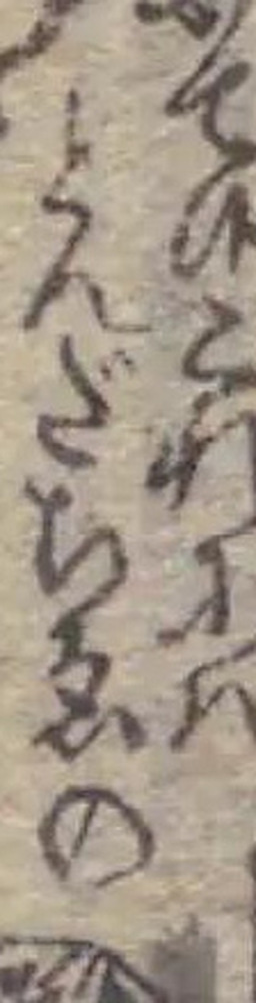とんだちゑの
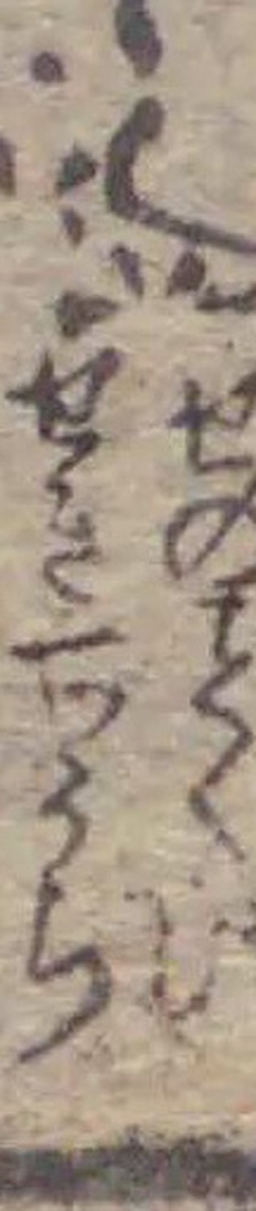せき一ツうち
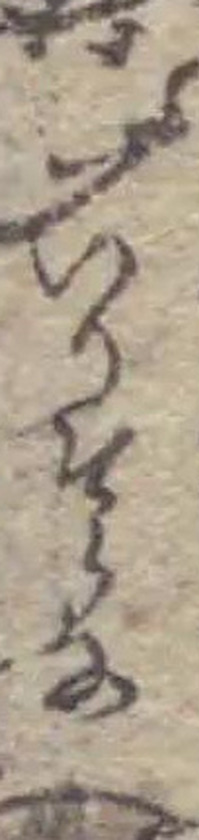いりそうな
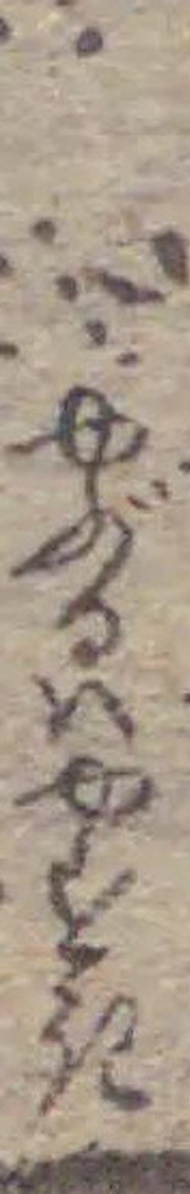やぶるはやすき
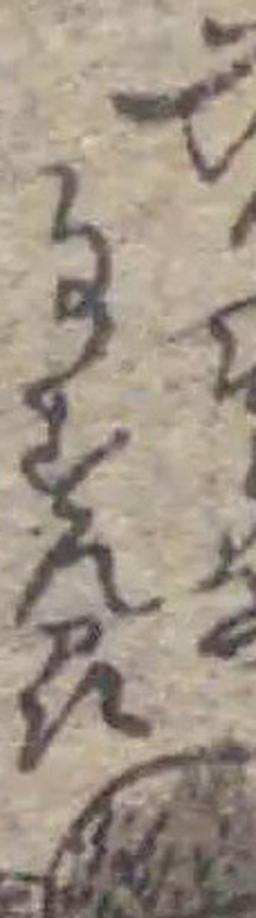事すん州
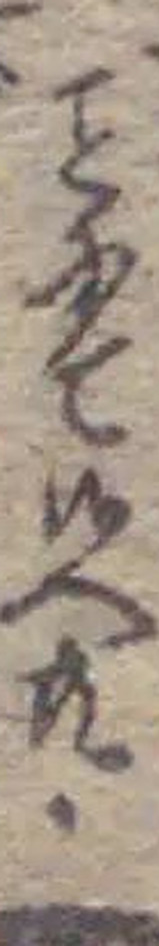ことにて候へ共
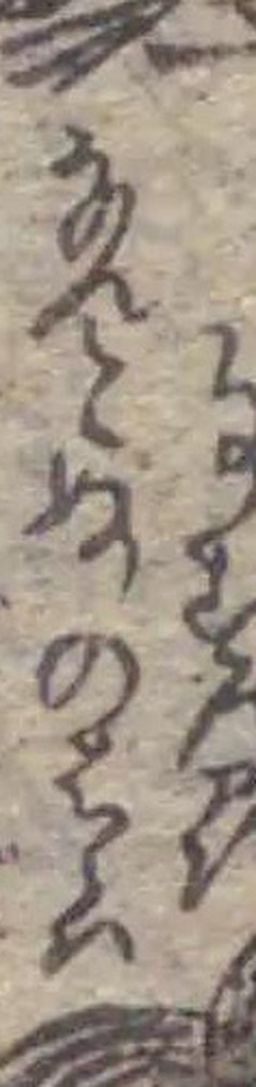なんとぬのはらは
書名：通増安宅関 2巻
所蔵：国立国会図書館 National Diet Library, JAPAN
